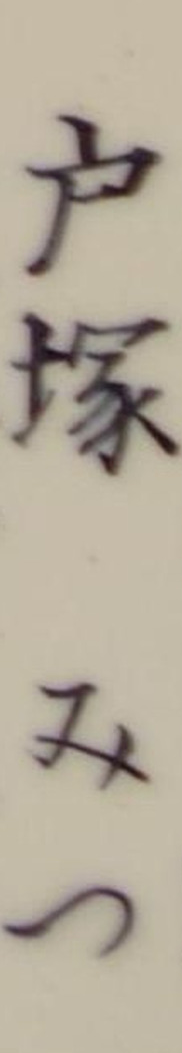戸塚みつ
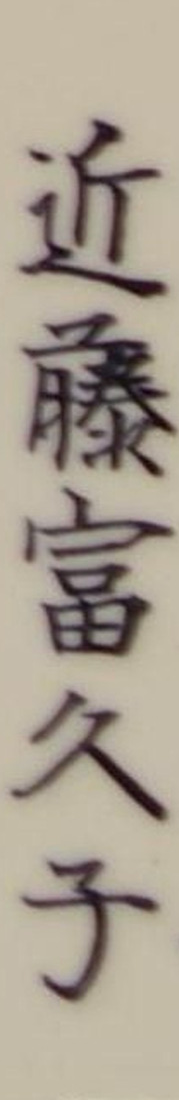近藤富久子
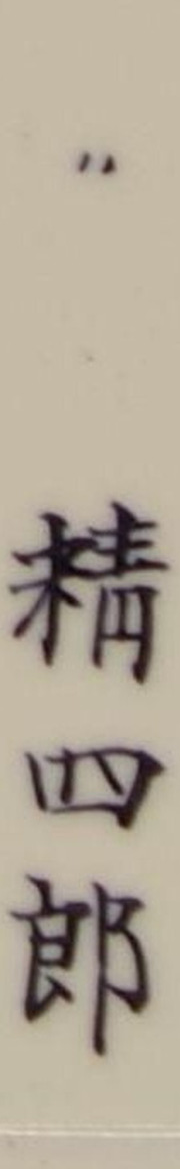精四郎
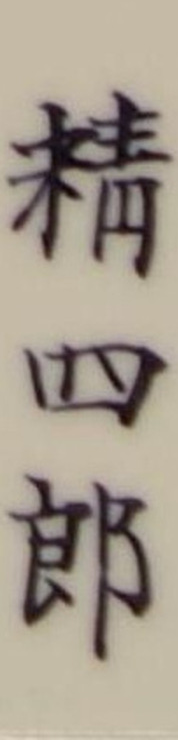精四郎
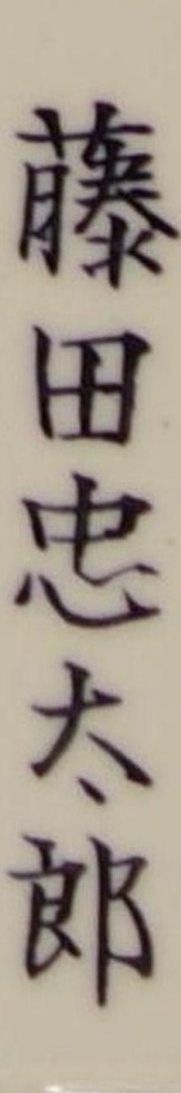藤田忠太郎
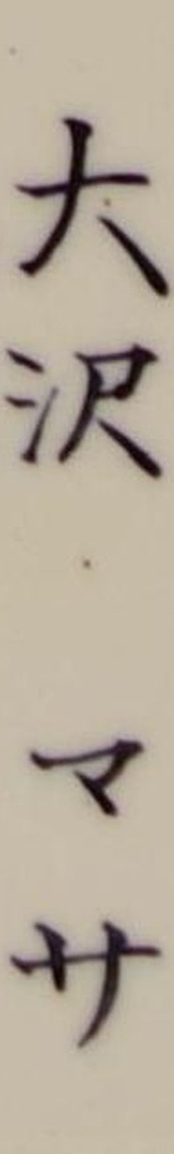大沢マサ
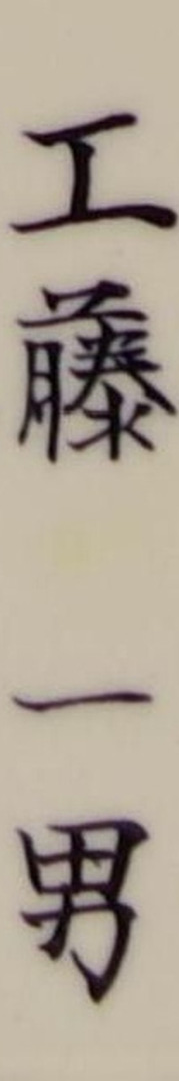工藤一男
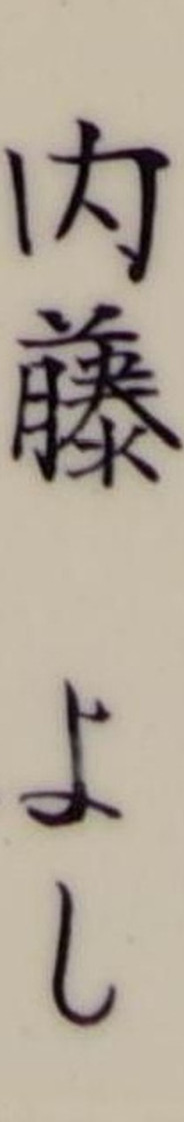内藤よし
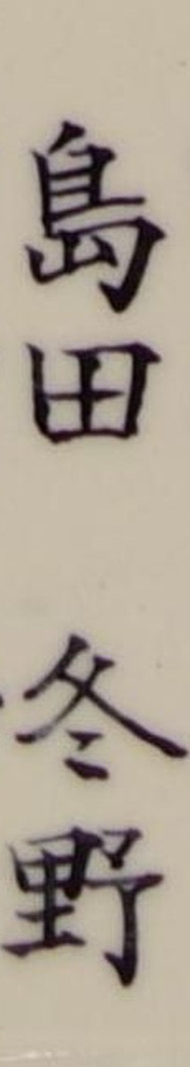島田冬野
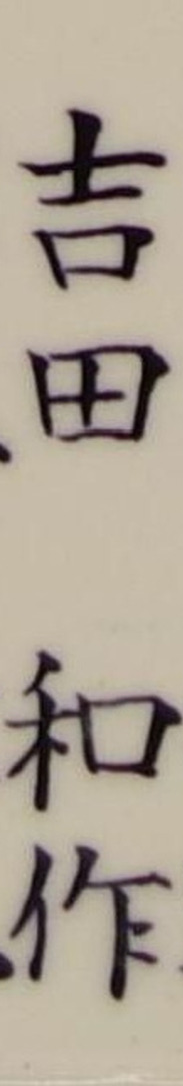吉田和作
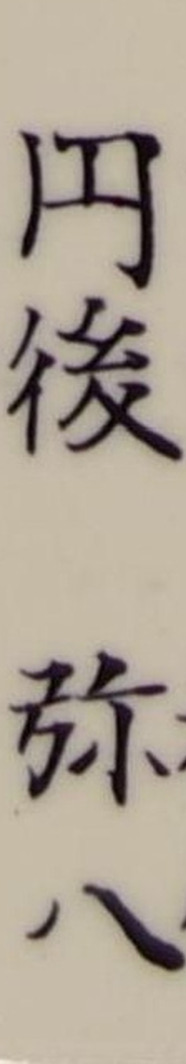円後弥八
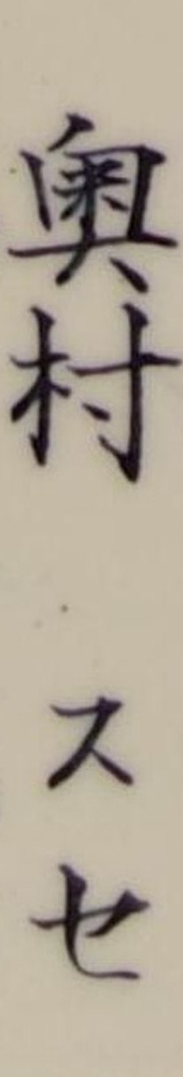奥村スセ
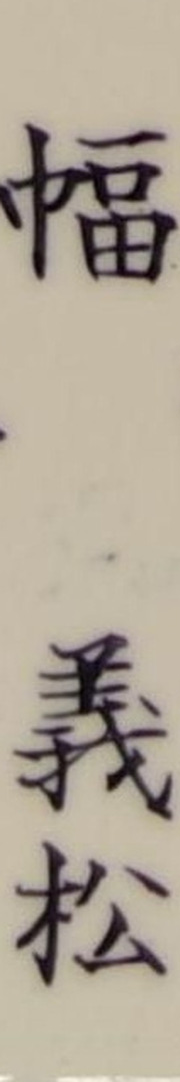幅義松
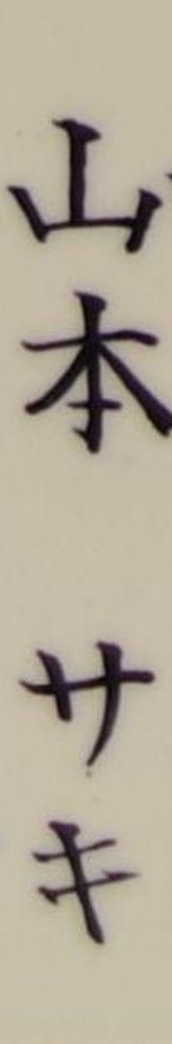山本サキ
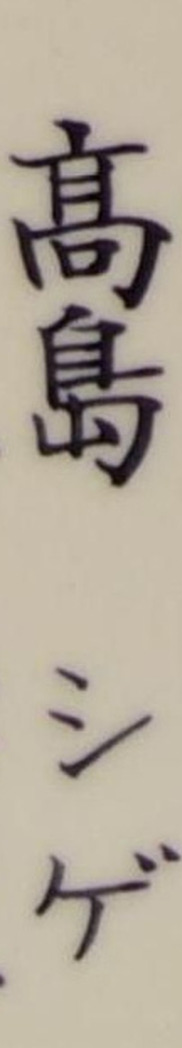高島シゲ
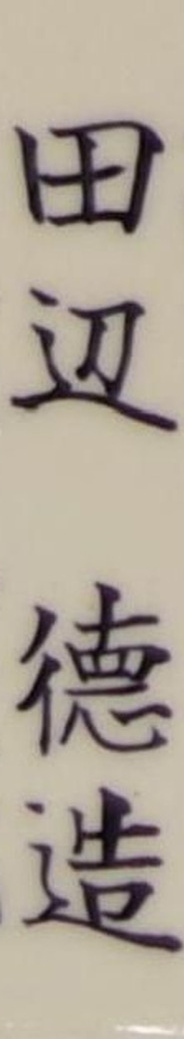田辺徳造
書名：M~S
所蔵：高野山金剛峯寺
